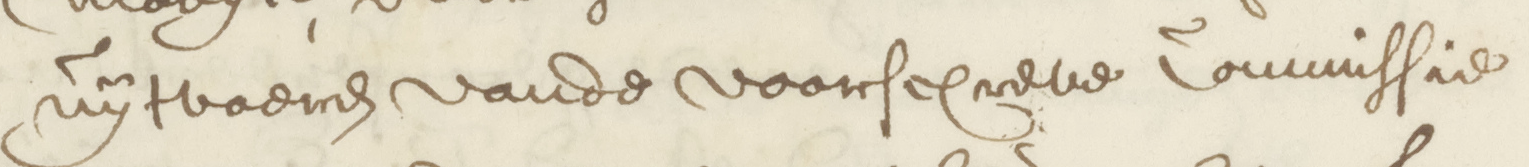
uijvoeren vande voorschreve Commissie
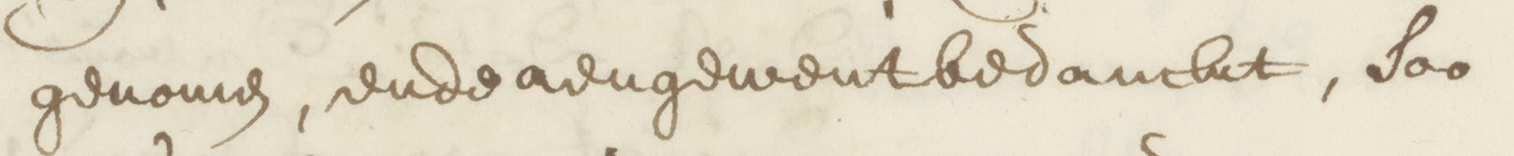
genomen, ende aengewent bedanckt, soo
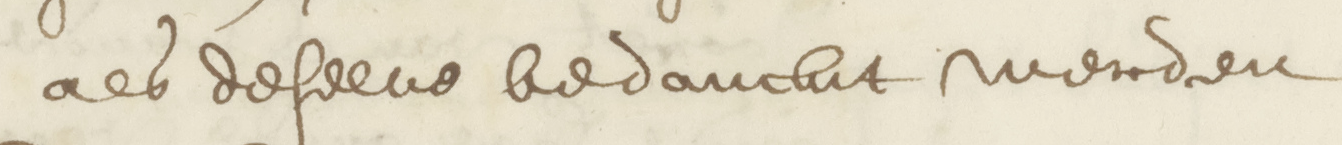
als deselve bedanckt werden
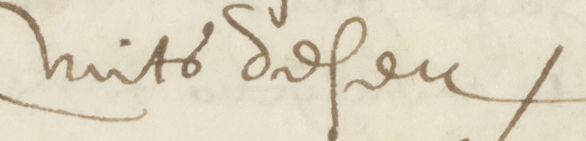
mits desen.
